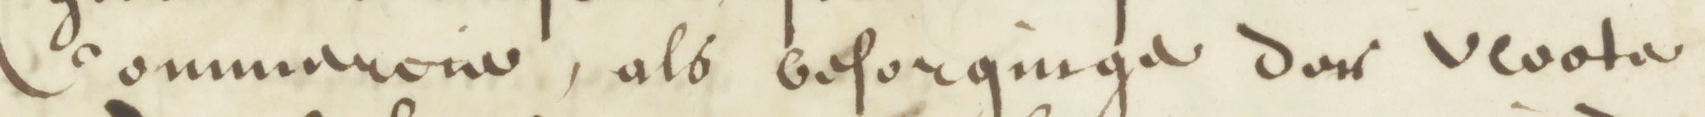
Commercie, als besorginge der vloote
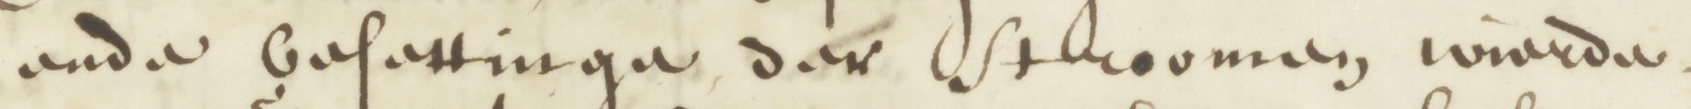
ende besettinge der stroomen wierde
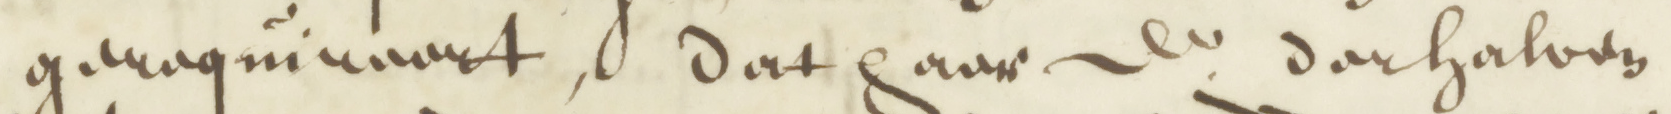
gerequireert, dat haer E. derhalven
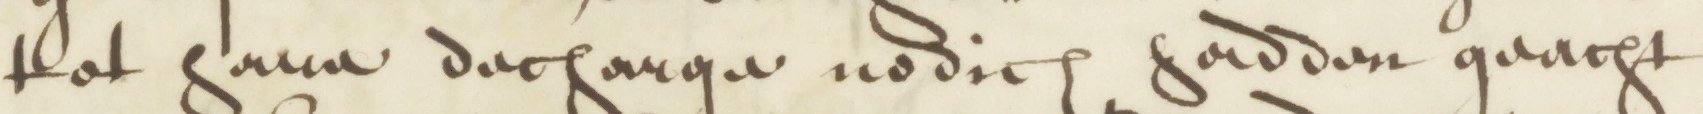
tot hare decharge nodich hadden geacht
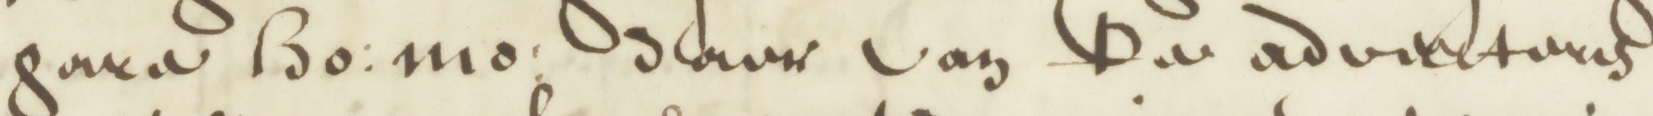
hare Ho: Mo: daer van te adverteren
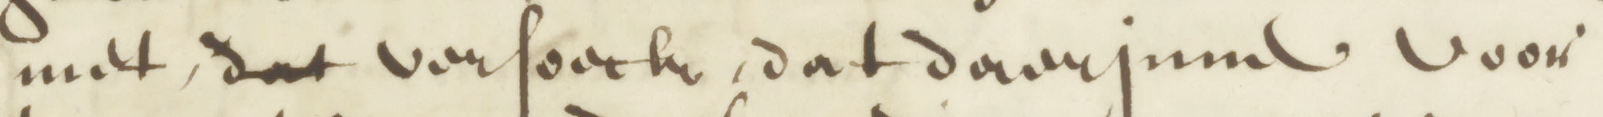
met dat versoeck, dat daerinne voor
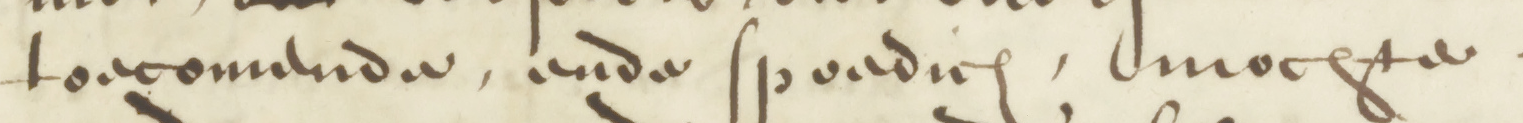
toecomende, ende spoedich, mochte
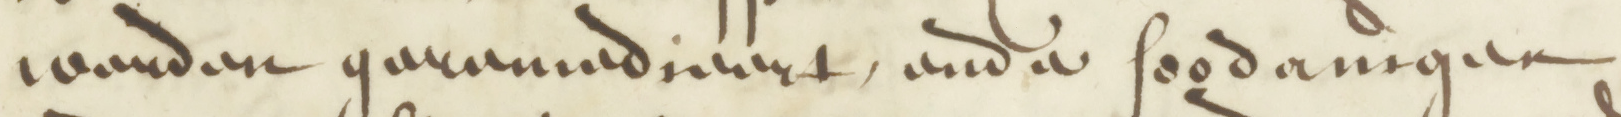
werden geremedieert, ende soodanigen
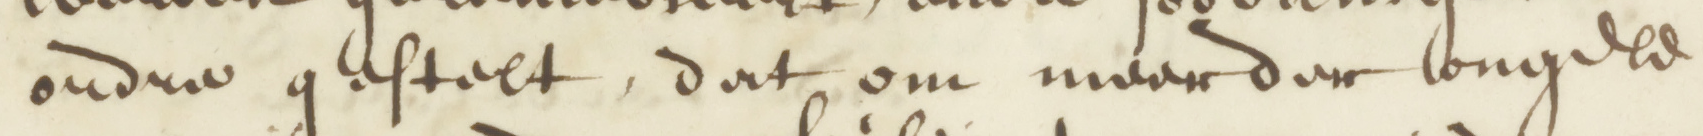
ordre gestelt, dat om meerder ongele„
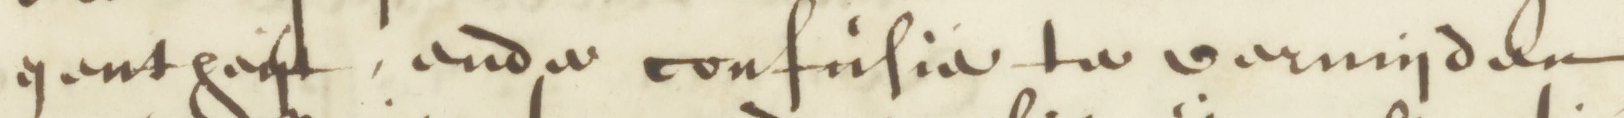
gentheijt, ende confusie te vermijden
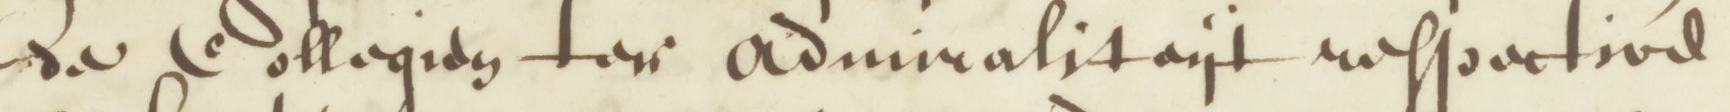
de Collegien ter Admiraliteijt respective„
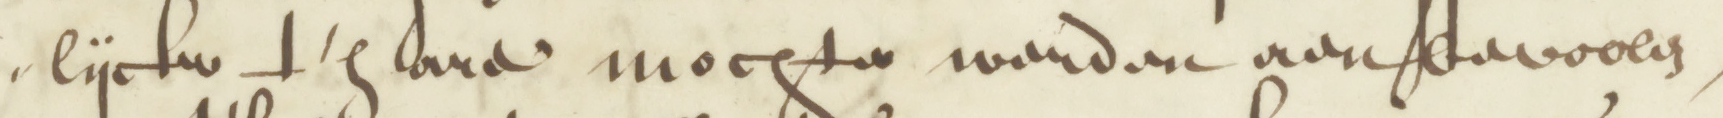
lijck t'hare mochten werden aenbevoolen,
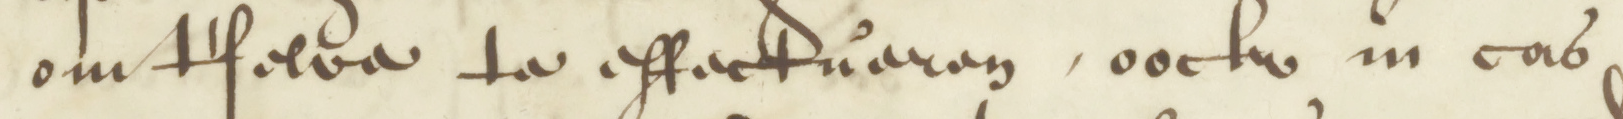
om t'selve te effectueren, oock in cas
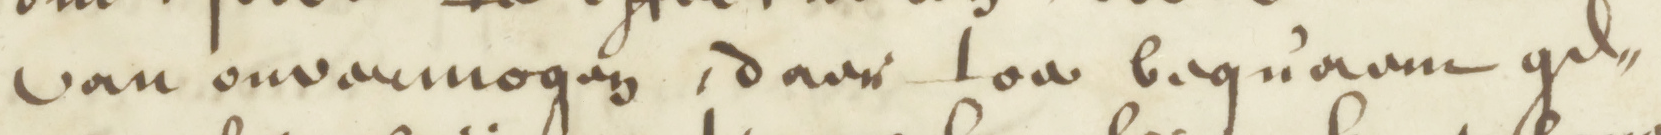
van onvermogen, daer toe bequame ge„
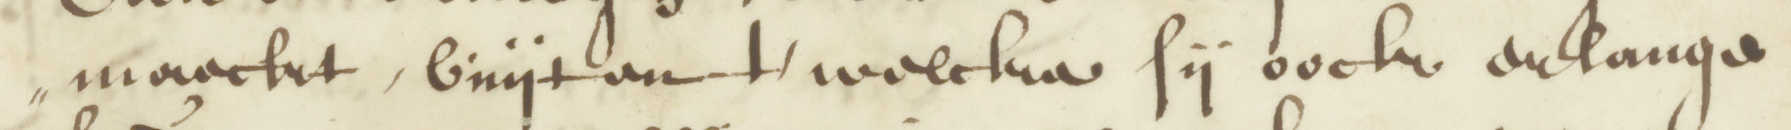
,,maeckt buijten t'welcke sij oock erlange
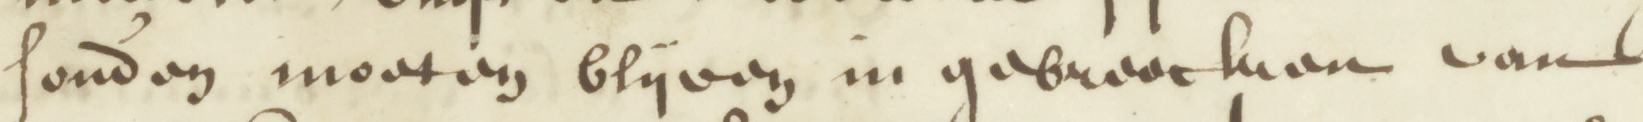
souden moeten blijven in gebreecken van
